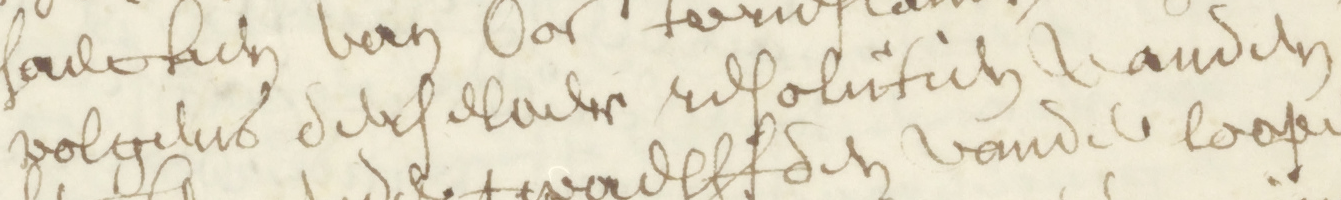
volgens derselver resolutien vanden
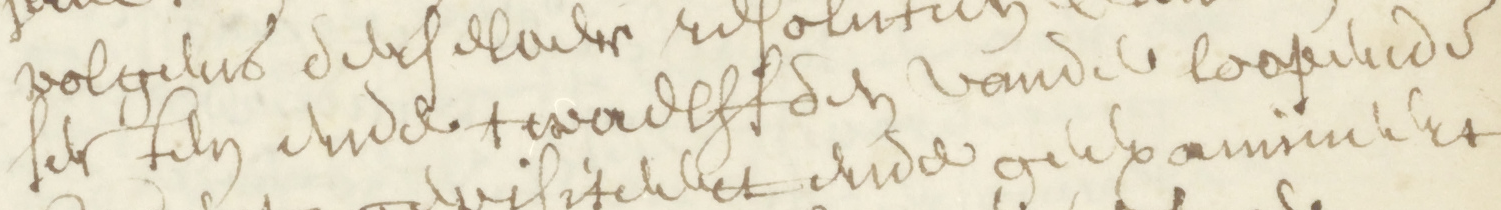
sesten ende twaelffden vande loopende
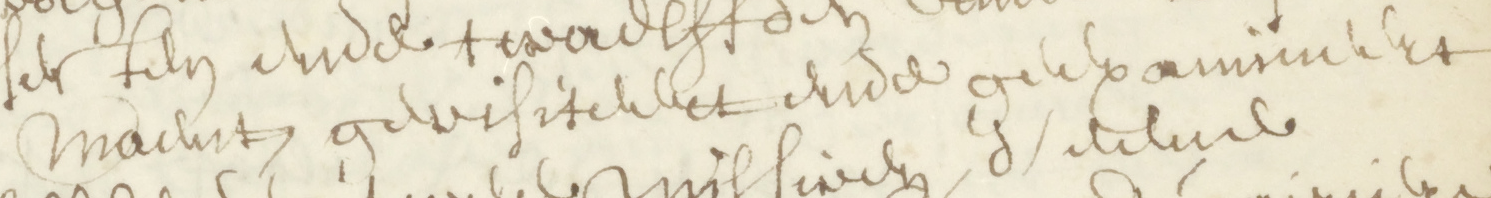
maent, gevisiteert ende geexamineert
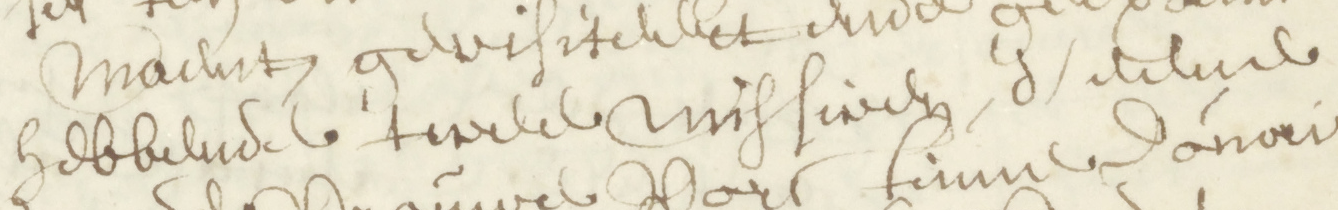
hebbende twee missiven, d'eene
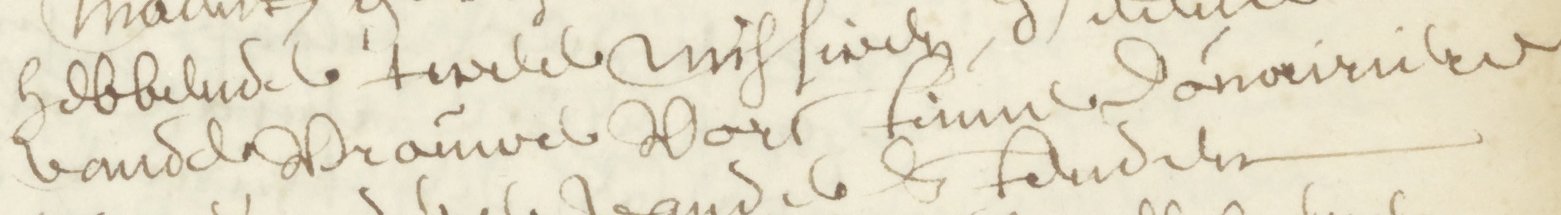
vande Vrouwe Vorstinne Douairiere
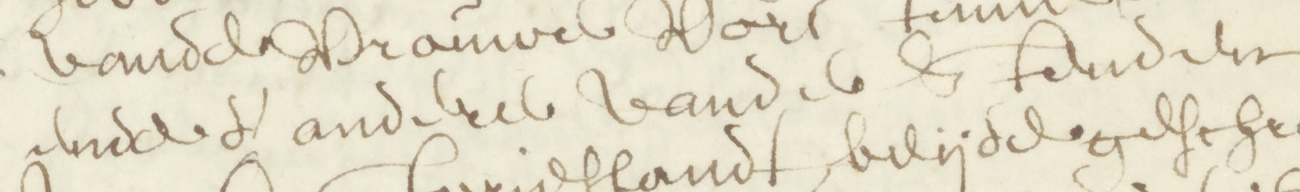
ende d'andere vande Stenden
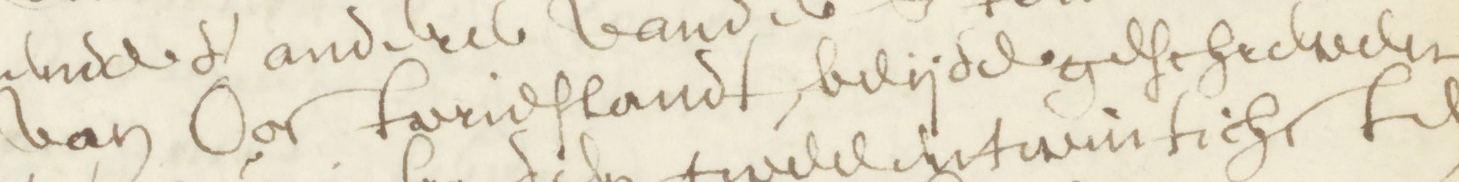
van Oostvrieslandt, beijde geschreven
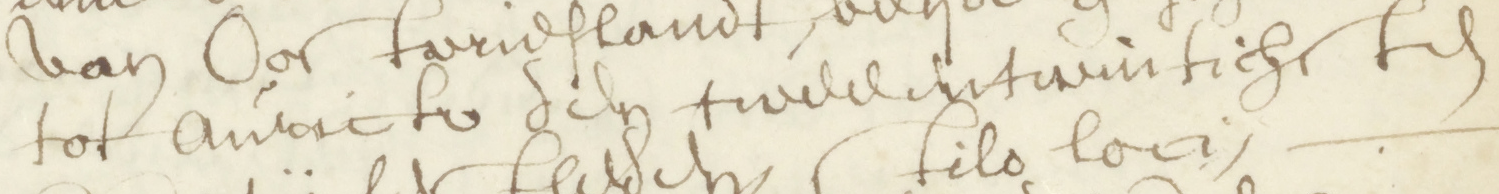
tot Aurick den tweentwintichsten
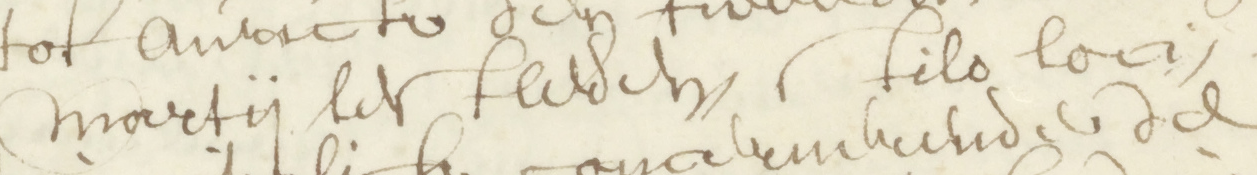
martij lestleden, stilo loci,
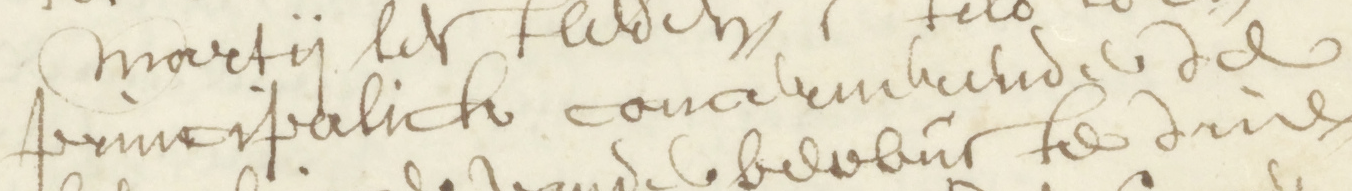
principalick concernerende de
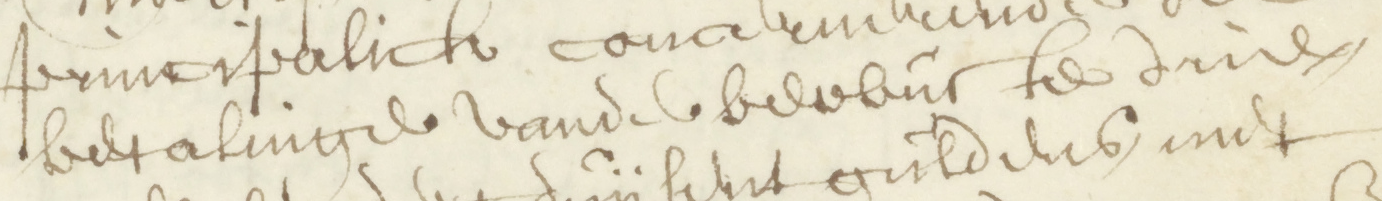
betalinge vande bewuste drie,,
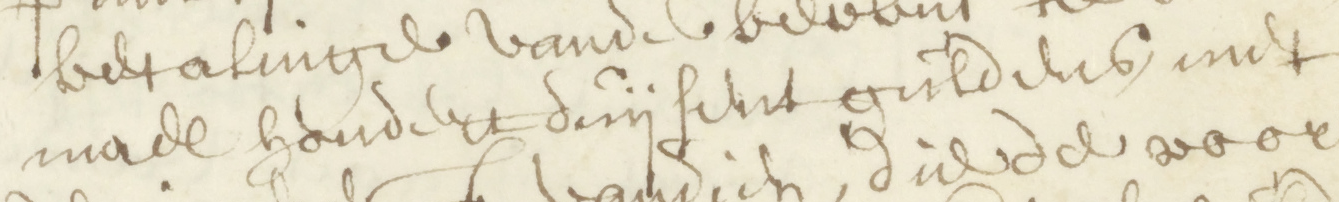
mael hondert duijsent guldens, met
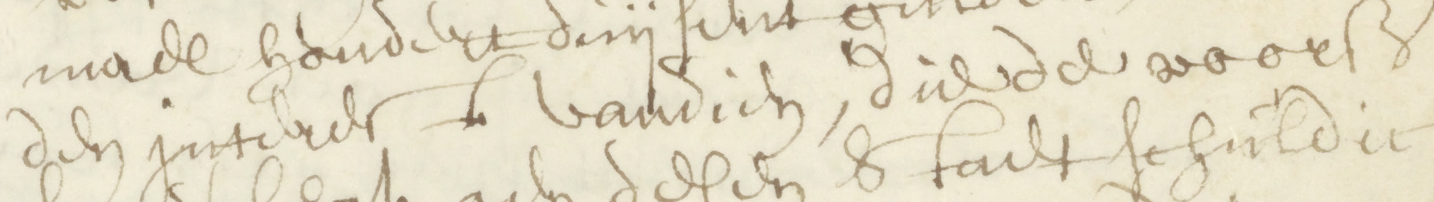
den interest vandien, die de voors
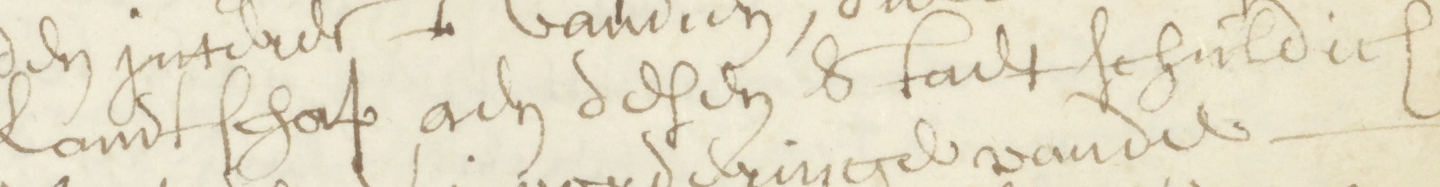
Landtschap aen desen Staet schuldich
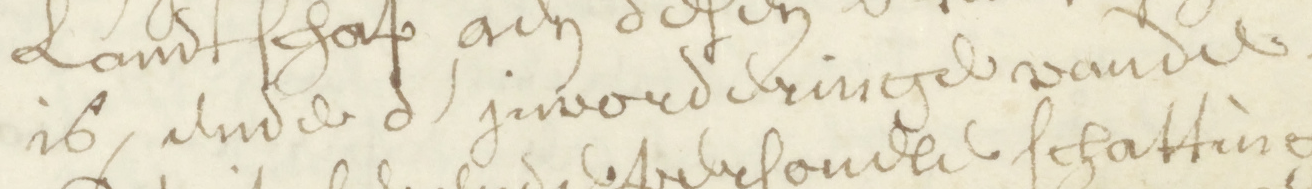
is, ende d‛ invorderinge vande
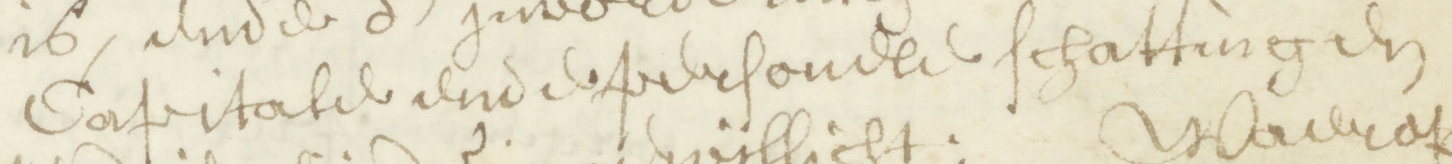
Capitale ende personele schattingen
